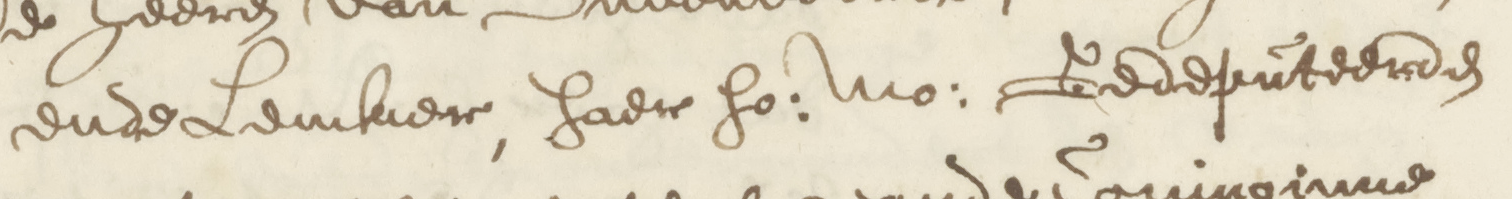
ende Lemker, haer Ho:Mo: Gedeputeerden
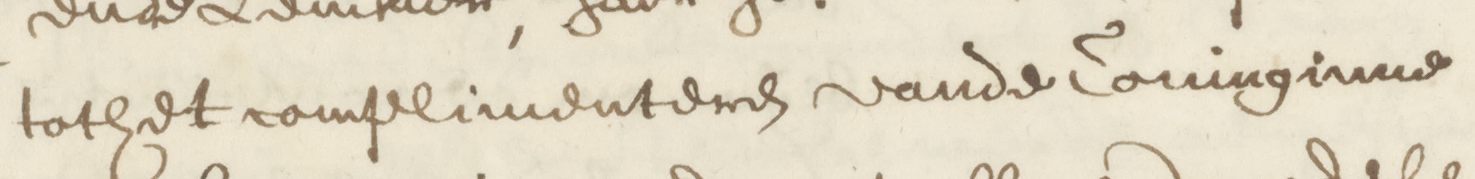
tot het complimenteren vande Coninginne
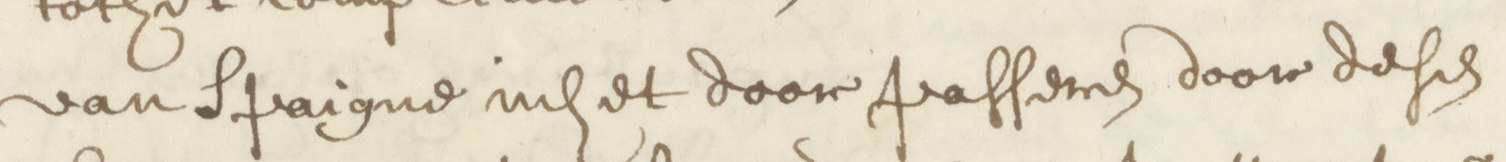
van Spaigne inhet door passeren door desen
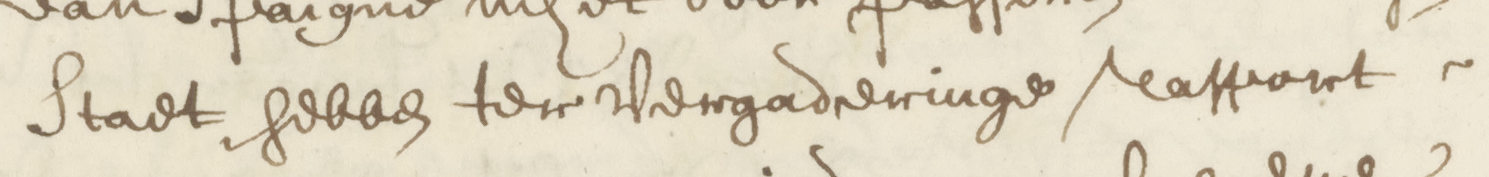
Staet, hebben ter Vergaderinge rapport
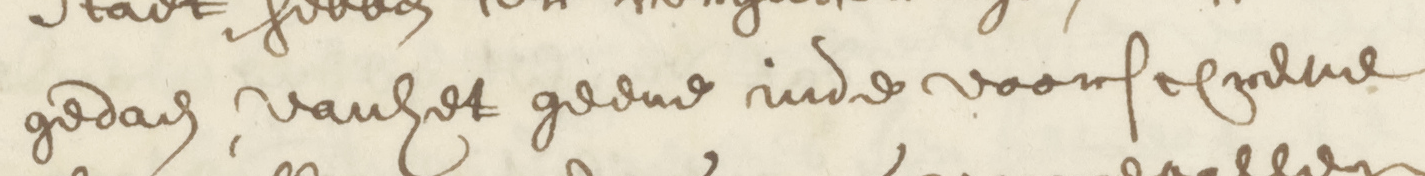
gedaen van het geene inde voorschreve
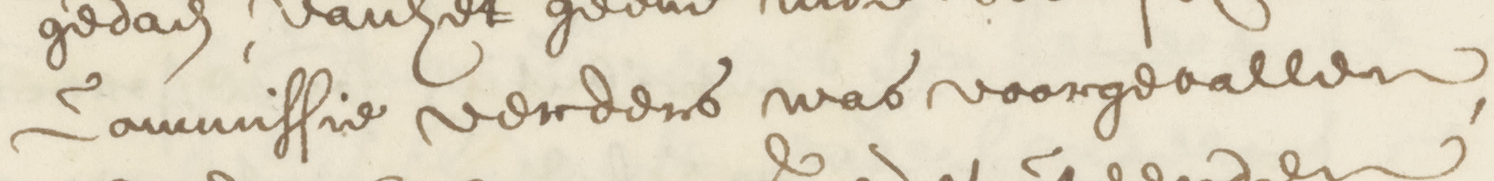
Commissie verders was voorgevallen
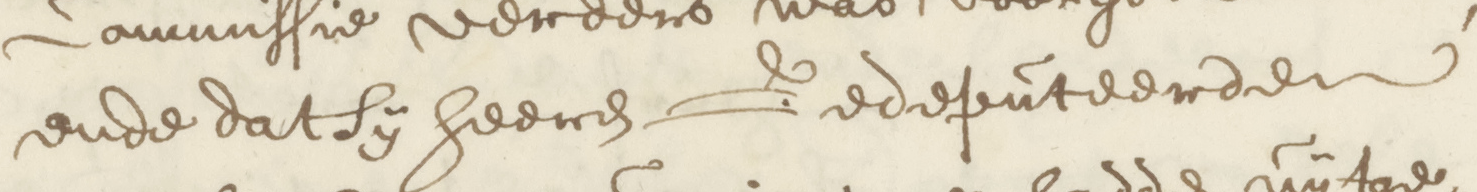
ende dat sij heeren Gedeputeerden
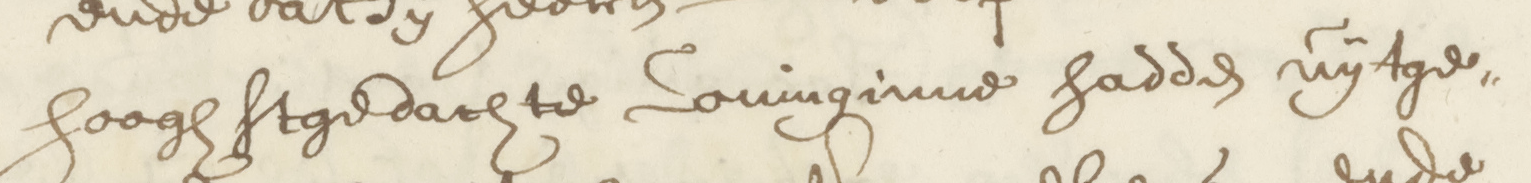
hooghstgedachte Coninginne hadden uijtge„
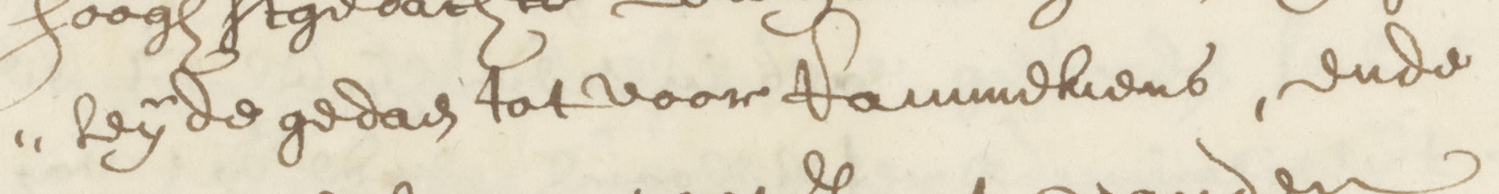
,,leyde gedaen tot voor Rammekens, ende
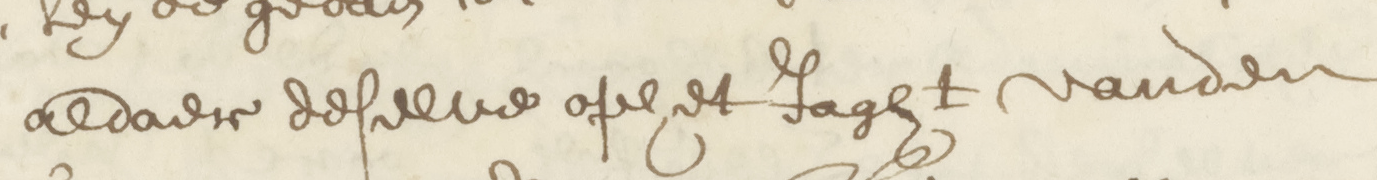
aldaer deselve ophet Jaght vanden
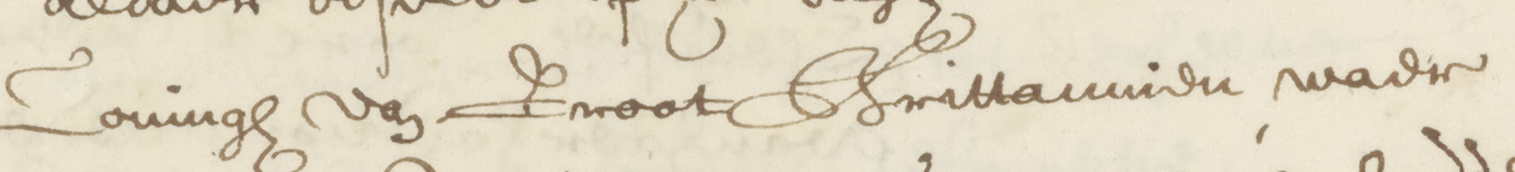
Coningh van Groot Brittannien waer
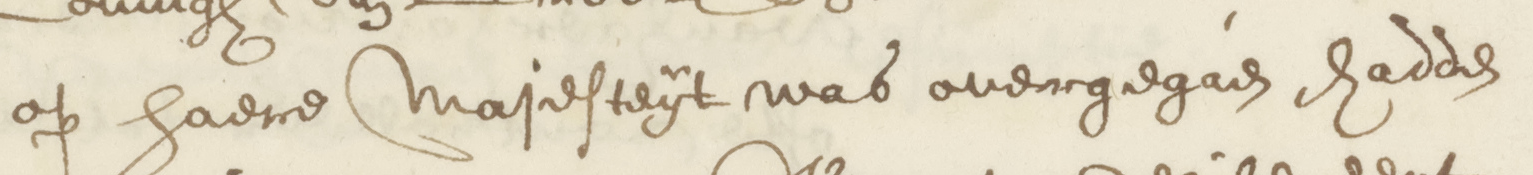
op haere Majesteijt was overgegaen hadden
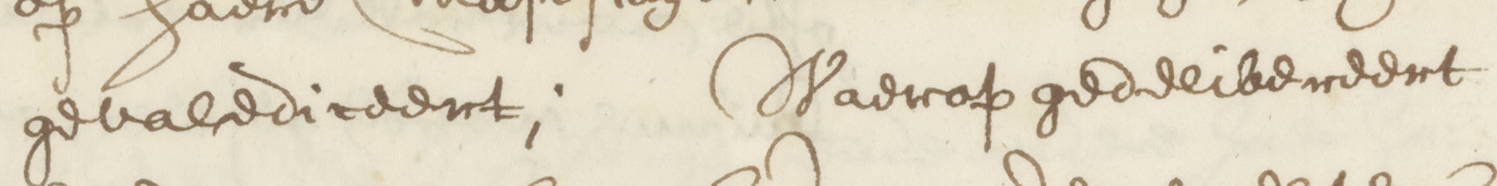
gevalediceert: Waerop gedelibereert
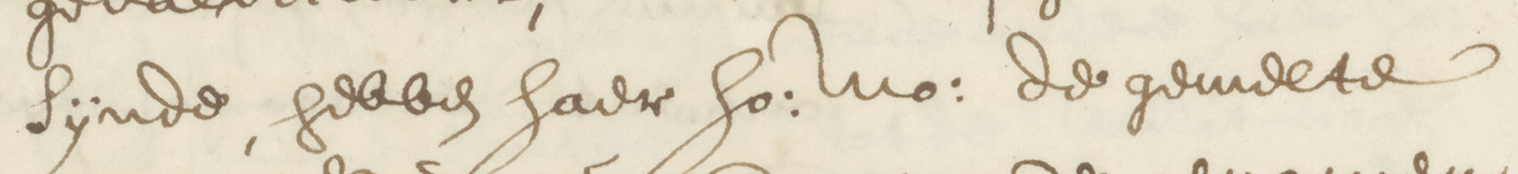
sijnde, hebben haer Ho:Mo: de gemelte
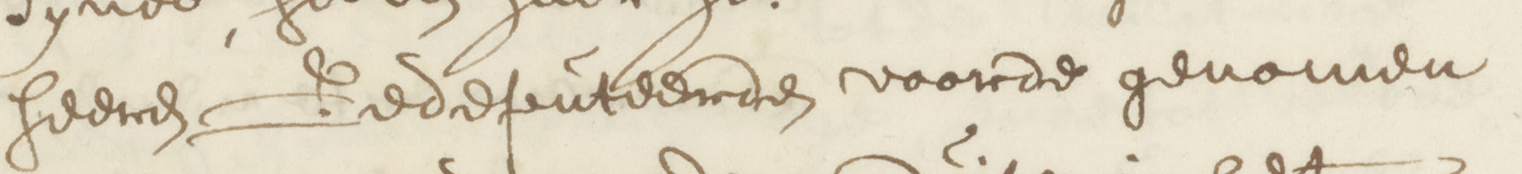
heeren Gedeputeerden voorde genomen
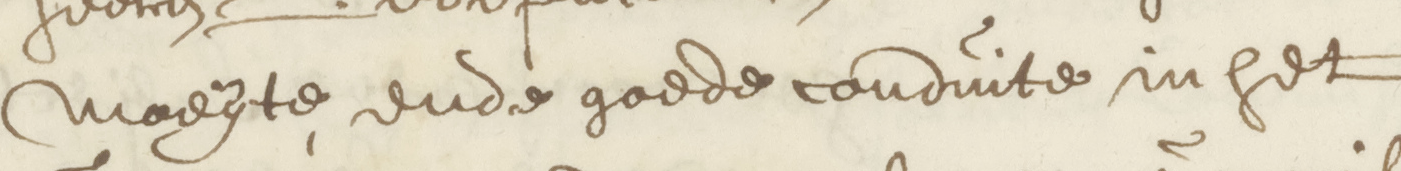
Moeijte ende goede conduite in het
